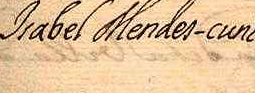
Izabel Mendes cunh.
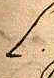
L.
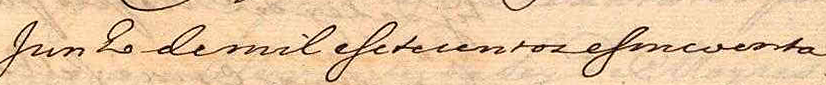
Junho de mil e setecentoz e sincoenta
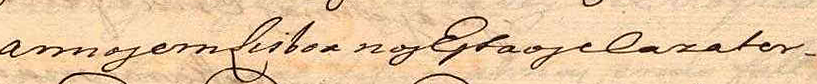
annos em Lisboa nos Estaos e Caza ter
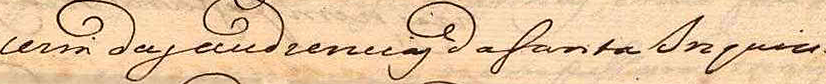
ceira das audiencias da santa Inquizi
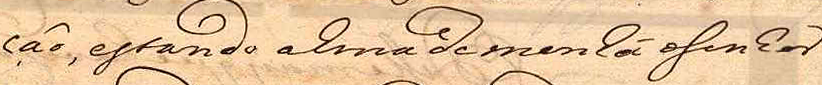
çaõ, estando ahi na de manhã o senhor
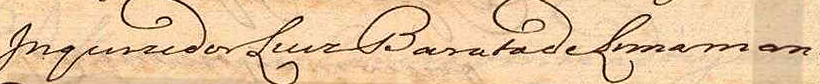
Jnquizidor Luiz Barata de Lima man
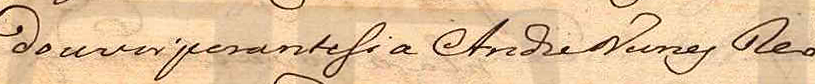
dou vir perante si Andre Nunes Reo
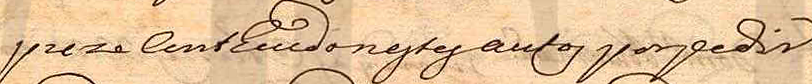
prezo Contheudo nestes autos por pedir
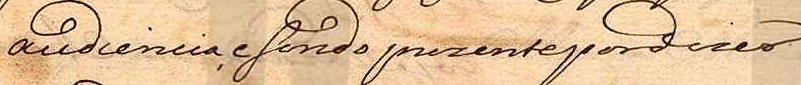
audiencia e sendo prezente por dizer
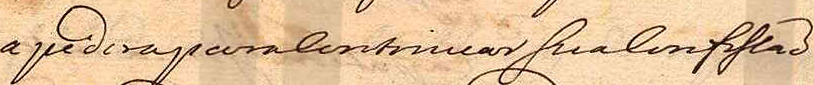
a pedira para continuar sua Confissaõ
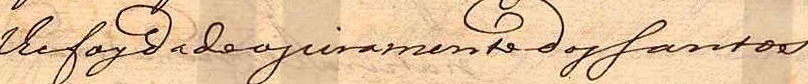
lhe foy dado o juramento dos santos
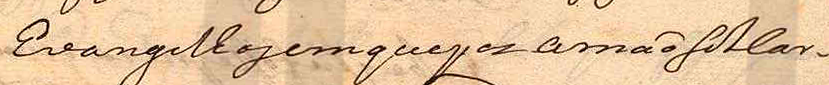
Evangelhos em que poz a maõ sob Car
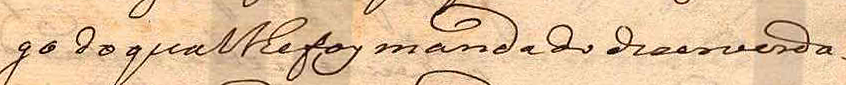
go do qual lhe foy mandado dizer verda
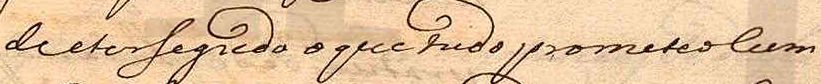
de e ter segredo o que tudo prometeo Cum
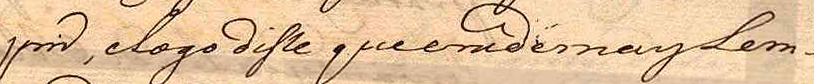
prir, e logo disse que era demais Lem
